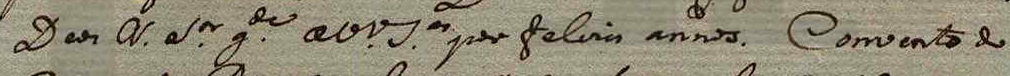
Deos N. S.or g.de a V V. S.as por felezis annos. Convento do
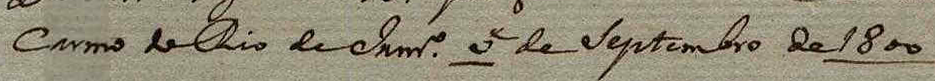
Carmo do Rio de Ian.o 5 de Septembro de 1800
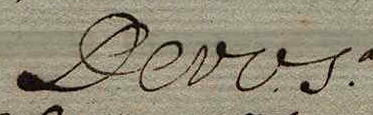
De V V. S.as
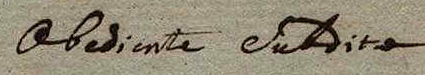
Obediente Subdito
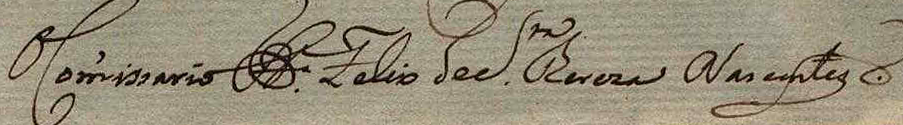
O Com̄issario Po Felix de S.ta Thereza Nascentes.
